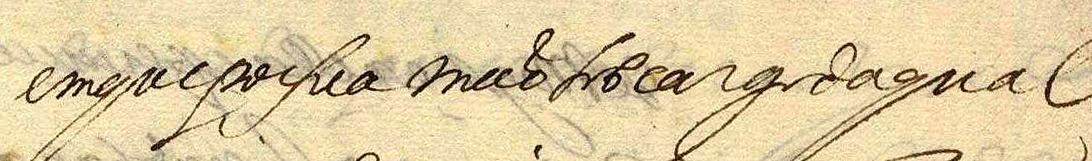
em que pos sua maõ sob cargo da qual
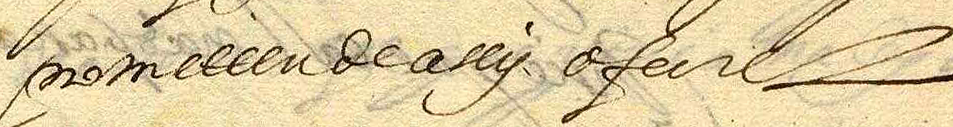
prometteu de assy o fazer
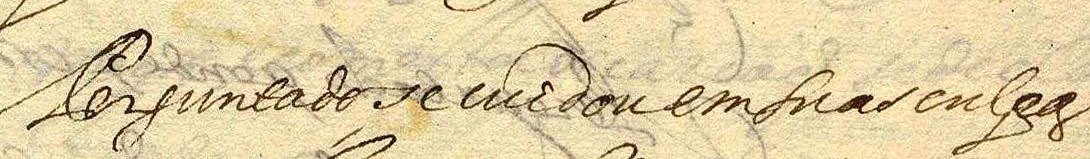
Perguntado se cuidou em suas culpas
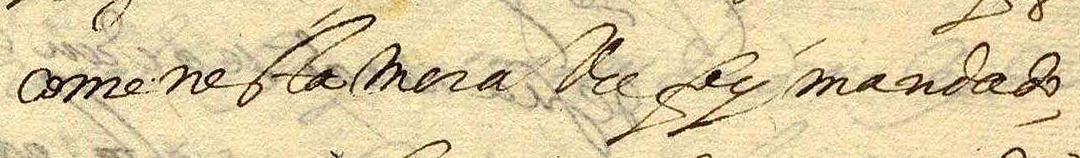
como nesta meza lhe foy mandado,
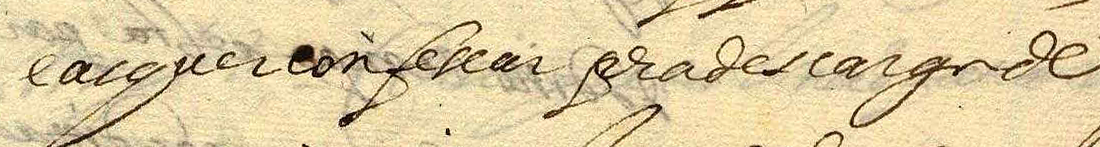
e as quer confessar pera descargo de
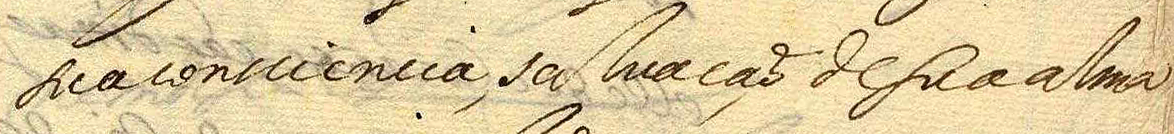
sua consciencia, saluaçaõ de sua alma
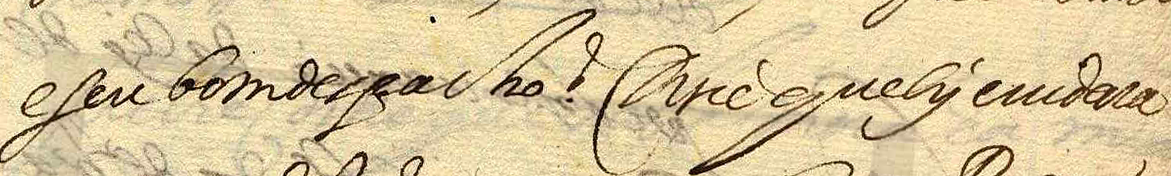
e seu bom despacho? Disse que sy cuidara
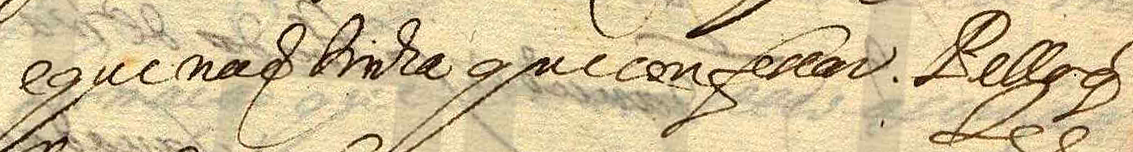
e que naõ tinha que confessar. Pello q̄
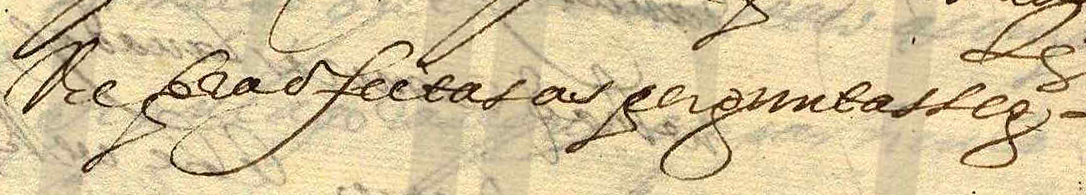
lhe forão feitas as perguntas segtes
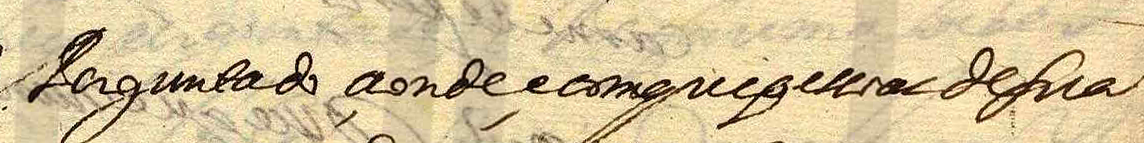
Perguntado aonde e com que pessoas de sua
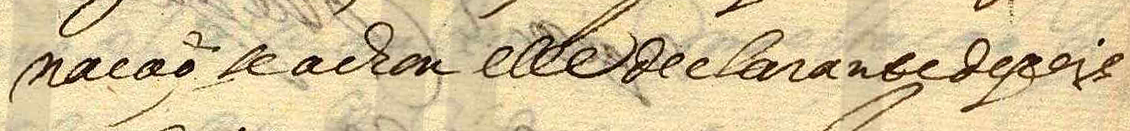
naçaõ se achou elle declarante depois
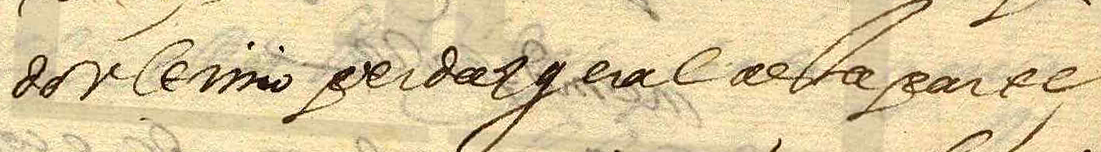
do vltimo perdaõ geral a esta parte
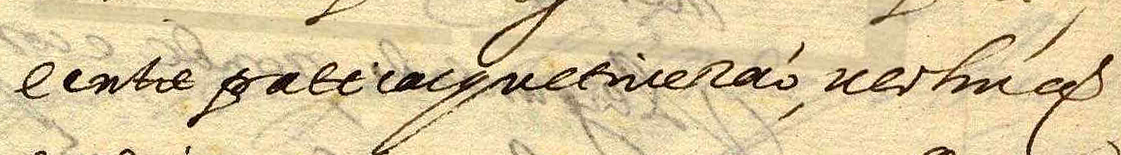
e entre praticas que tiueraõ, ueo huā
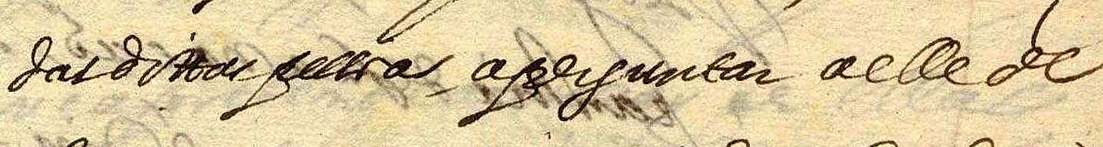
das dittas pessoas, a perguntar a elle de
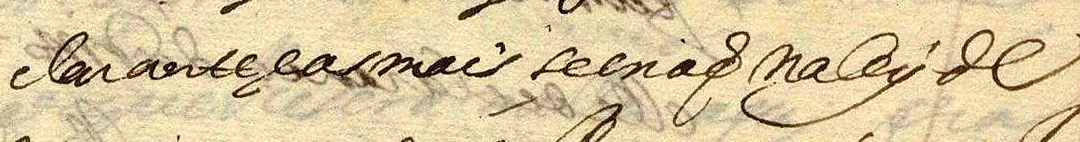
clarante, e as mais se criaõ na ley de
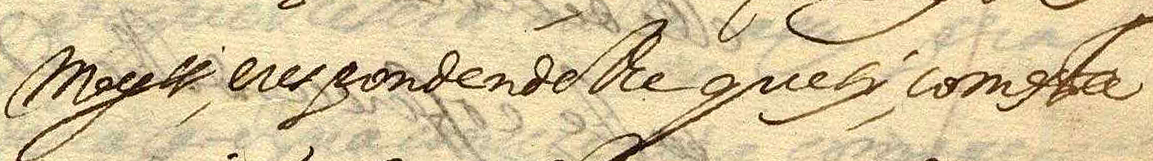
Moyses, e respondendolhe que sy, com esta
